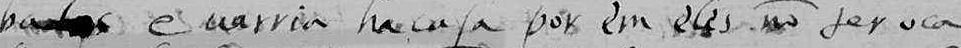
bados e uarria ha casa por em eles n̄o ter oca
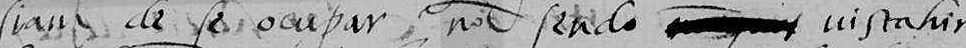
siam de se ocupar n̄o sendo __ uista hir
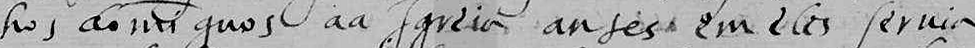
hos dom̄iguos aa Jgreia antes em eles seruia
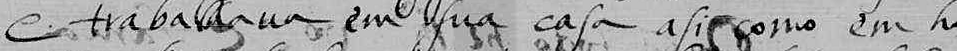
e trabalhaua em sua casa asi como em hos
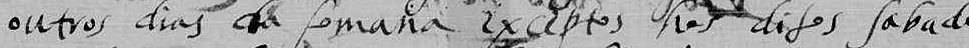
outros dias da somana excepto hos ditos sabados
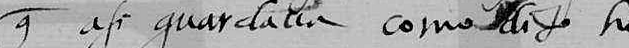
q̄ asi guardaua como dito he
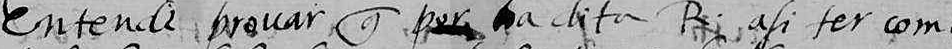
Entende prouar q̄ por ha dita R. asi ter come
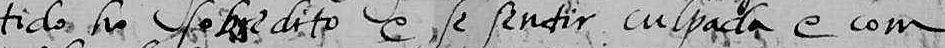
tido ho sobredito e se sentir culpada e com
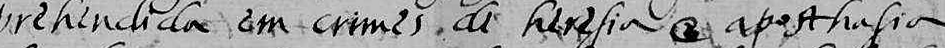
prehendida em crimes de heresia e apostasia
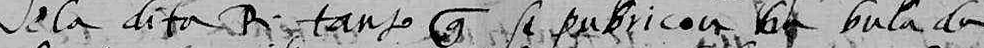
ela dita R. tanto q̄ se pubricou ha bula da
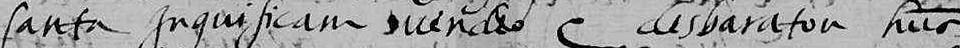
santa Jnquisiçam uendeo e desbaratou hūas
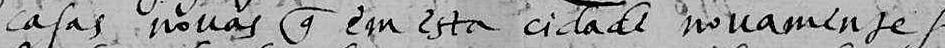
casas nouas q̄ em esta cidade nouamente so
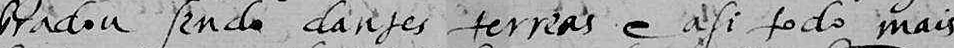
bradou sendo dantes terreas e asi todo mais
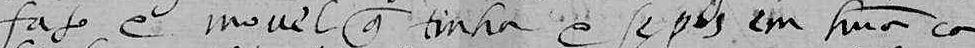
fato e mouel q̄ tinha e se pos em hūa ca
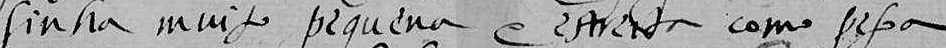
sinha muito pequena e estreita como pesoa
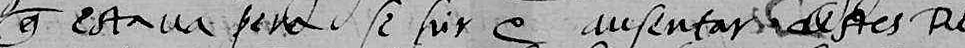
q̄ estaua pera se hir e ausentar destes Rei
